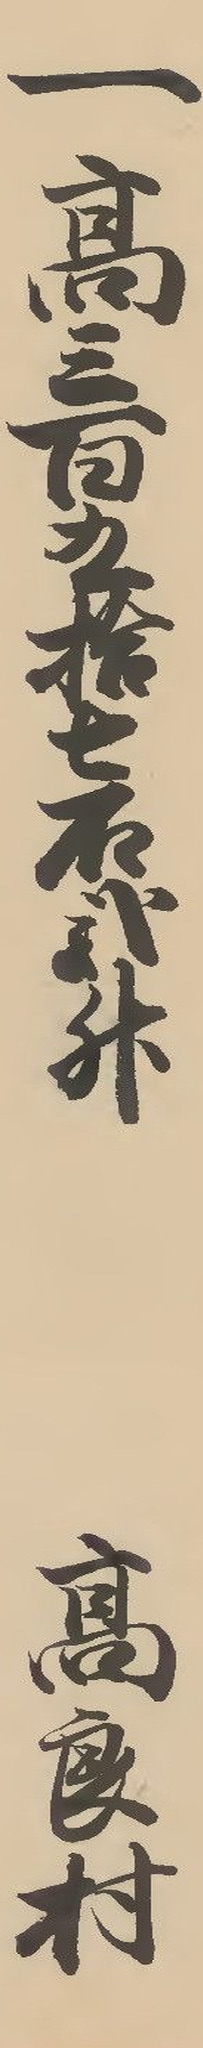一髙三百九拾七石弐升髙良村
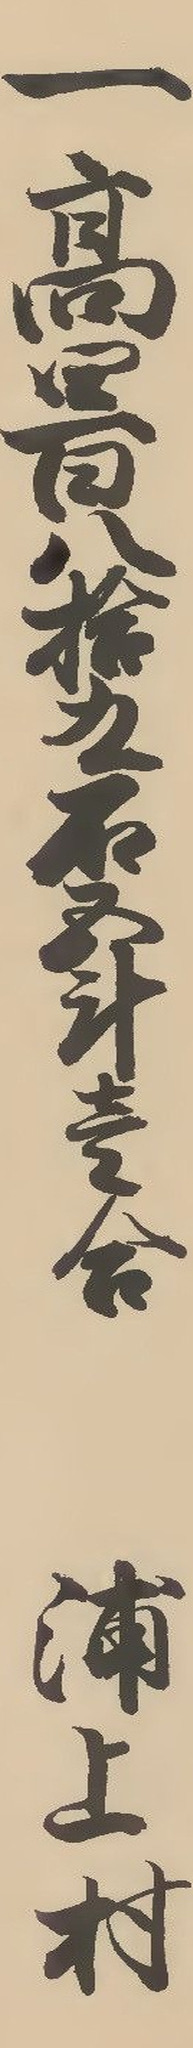一髙四百八拾九石五斗壱合浦上村
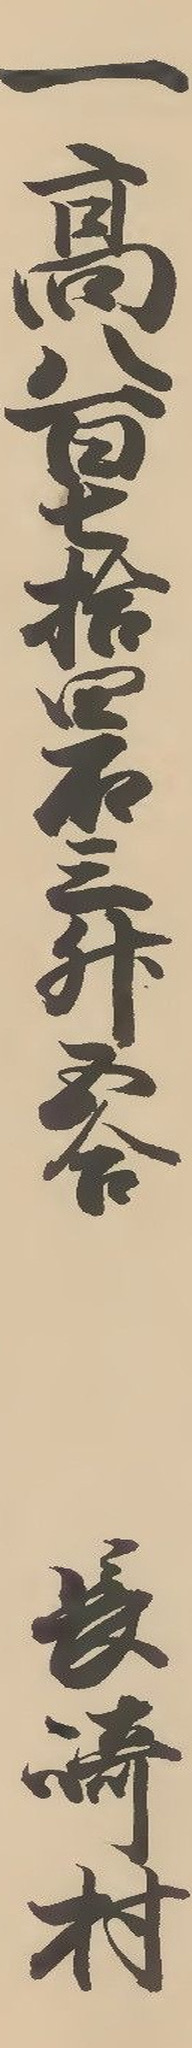一髙八百七拾四石三升五合長崎村
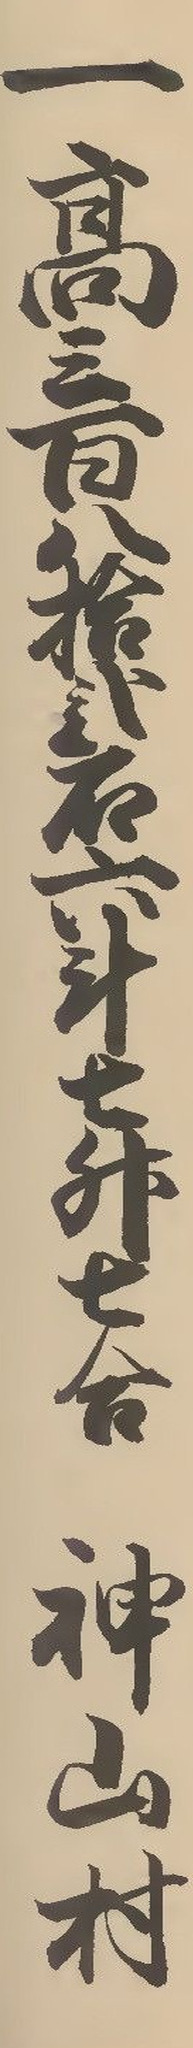一髙三百八拾弐石六斗七升七合神山村
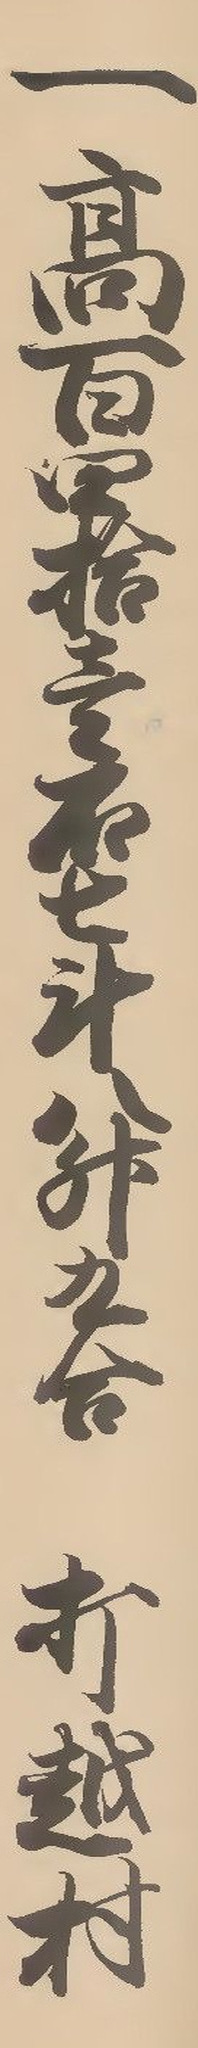一髙百四拾壱石七斗八升九合打越村
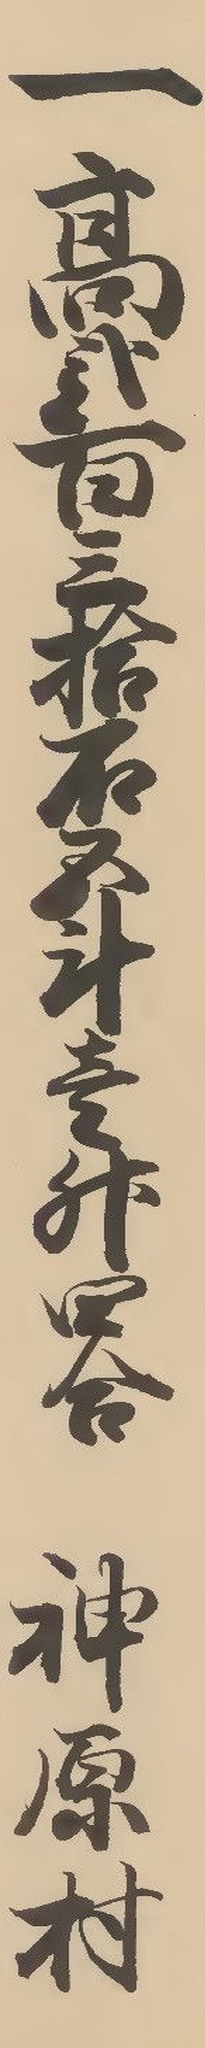一髙弐百三拾石五斗壱升四合神原村
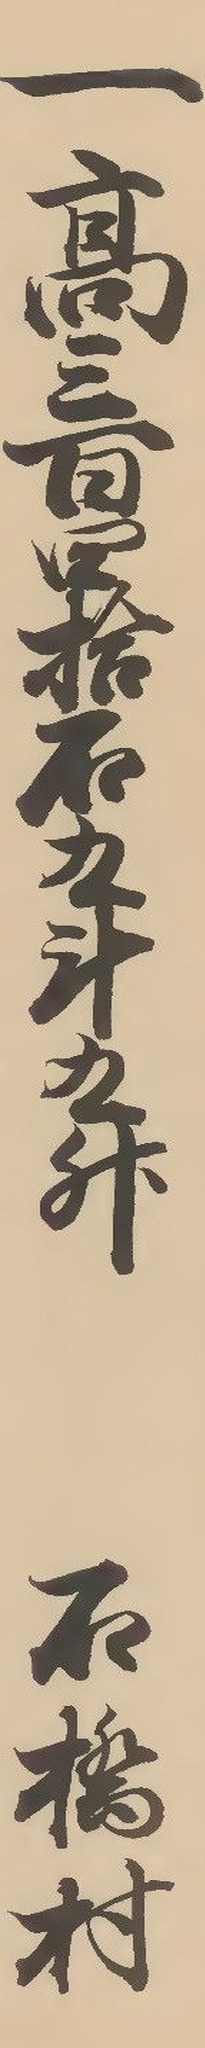一髙三百四拾石九斗九升石橋村
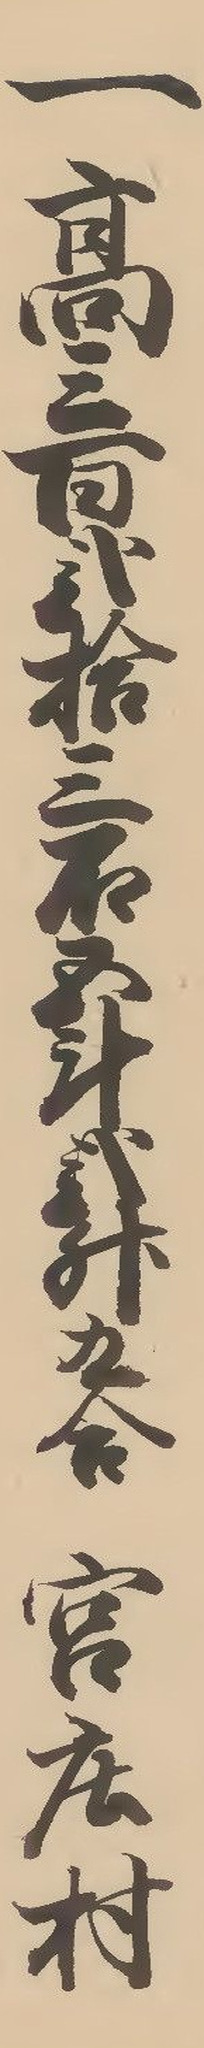一髙三百弐拾三石五斗弐升九合宮庄村

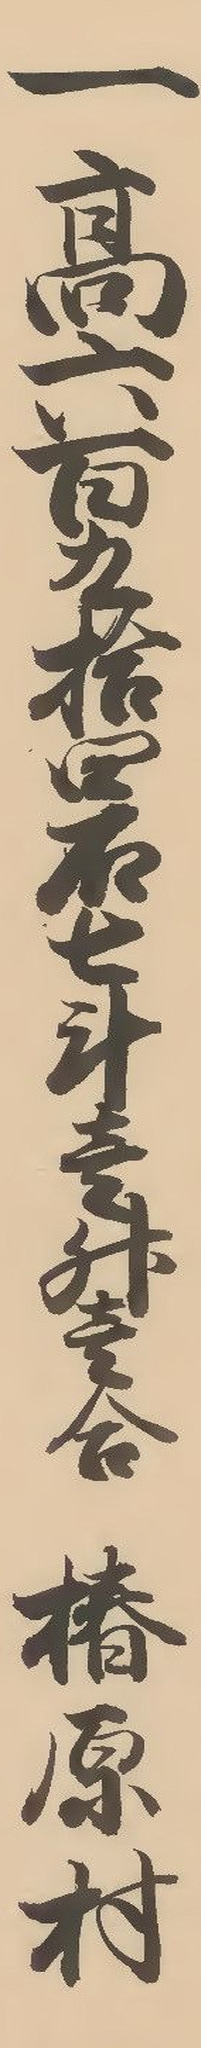一髙六百九拾四石七斗壱升壱合椿原村
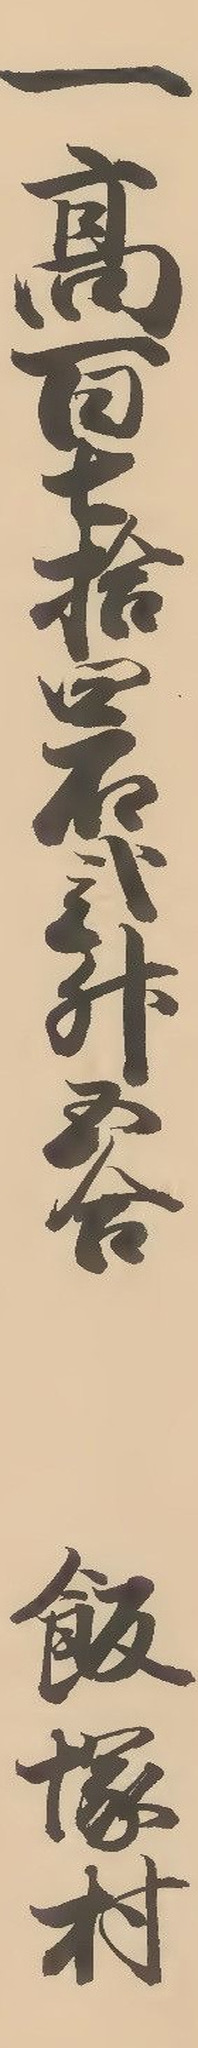一髙百七拾四石弐升五合飯塚村
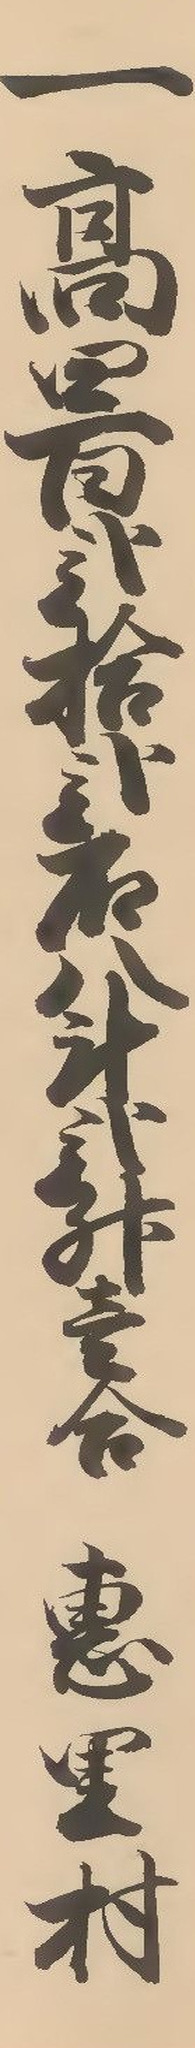一髙四百弐拾弐石八斗弐升壱合恵里村
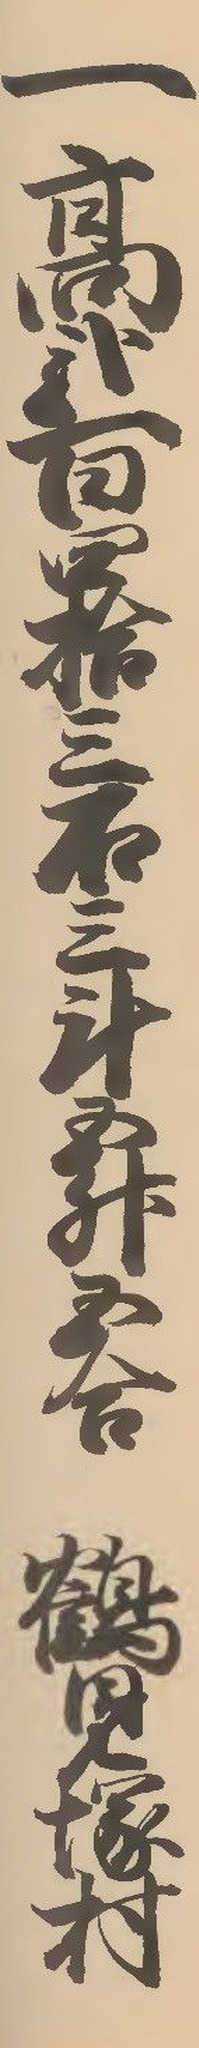一髙弐百四拾三石三斗五升五合鶴見塚村
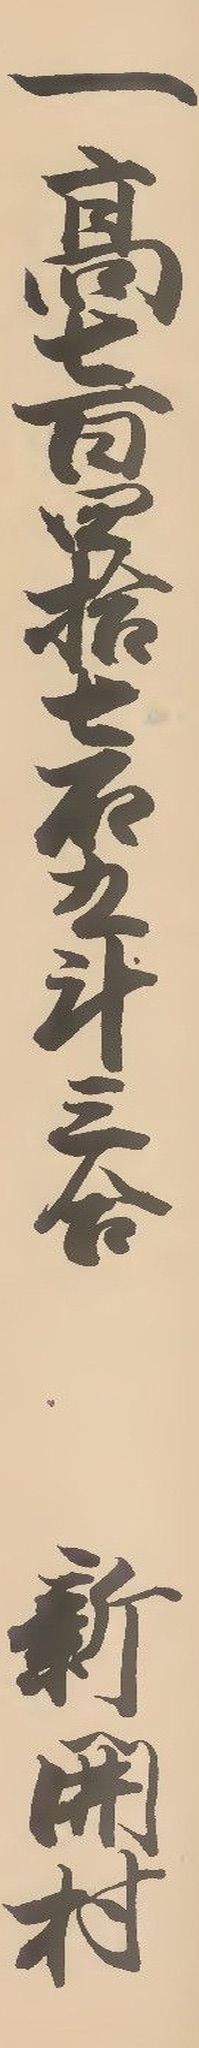一髙七百四拾七石九斗三合新開村
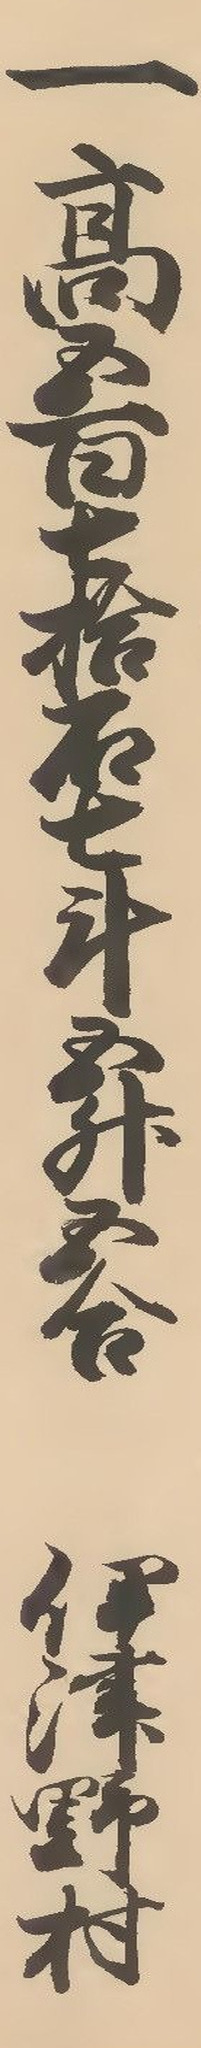一髙五百七拾石七斗五升五合伊津野村
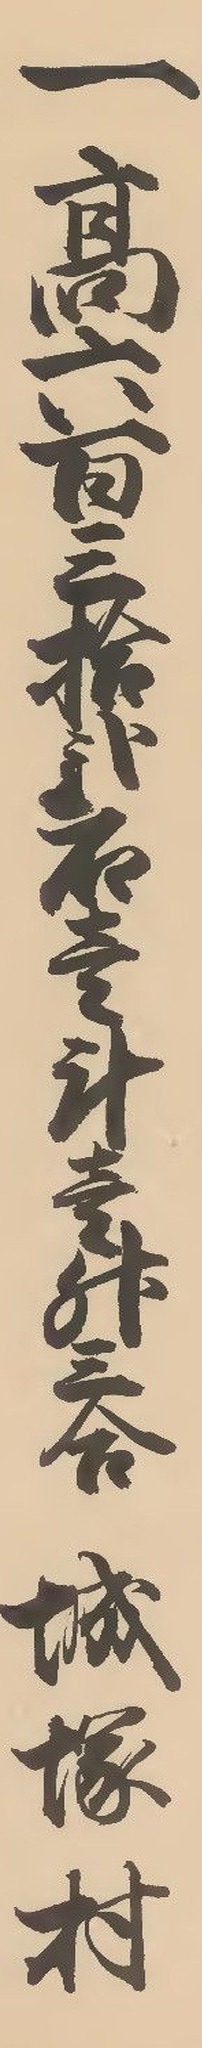一髙六百三拾弐石壱斗壱升三合城塚村
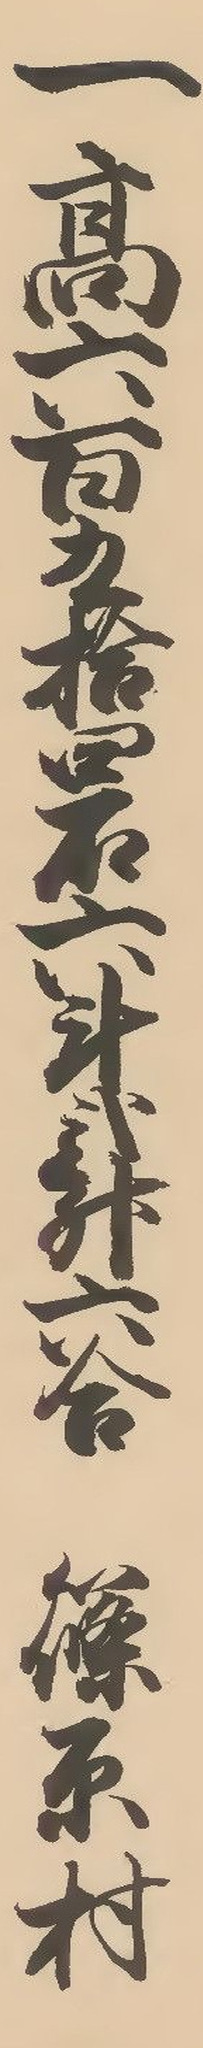一髙六百九拾四石六斗弐升六合篠原村
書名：肥後国郷帳
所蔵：国立公文書館 National Archives of Japan
